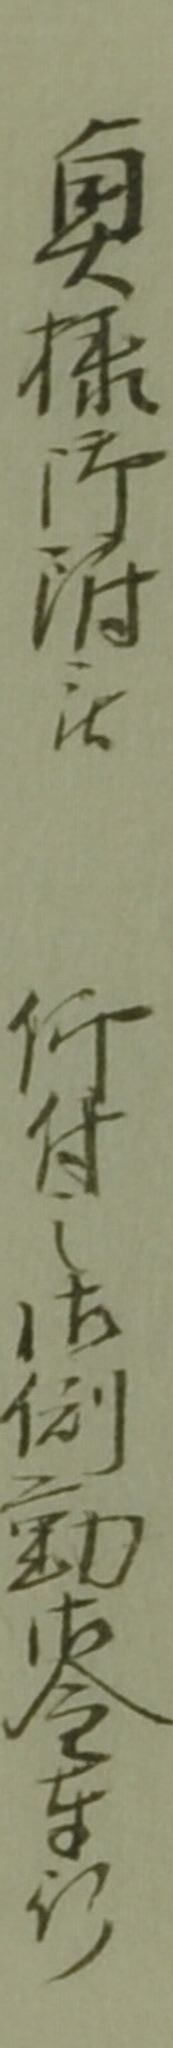奥様御附被仰付之御側勤御金奉行
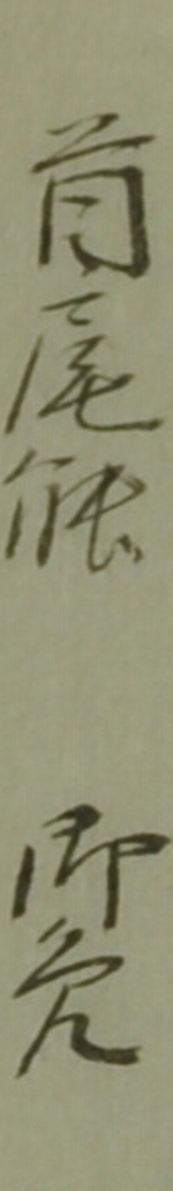首尾能御免
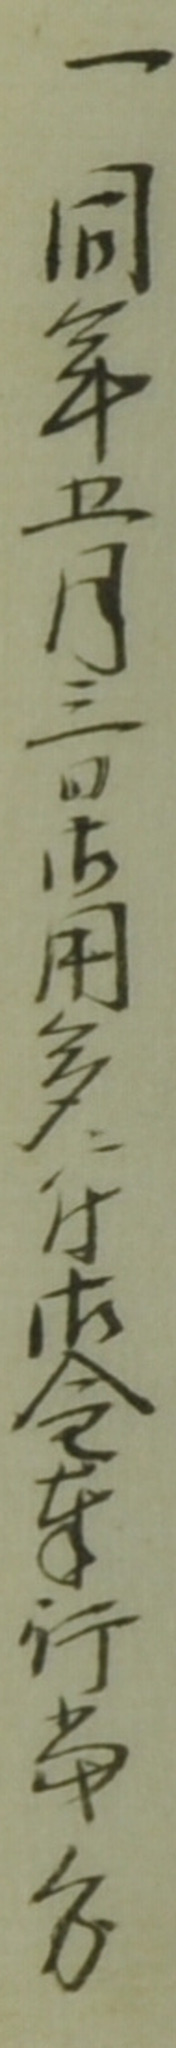一同年五月三日御用多付御金奉行当分
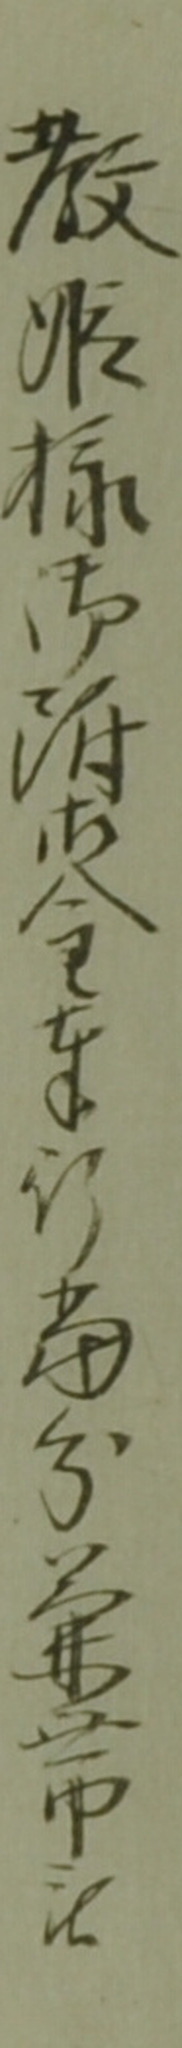教姫様御附御金奉行当分兼帯被
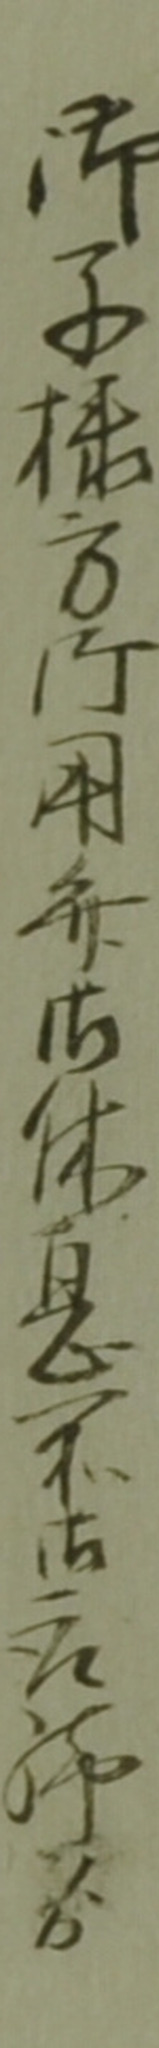御子様方御用弁御休息所御取締ゟ
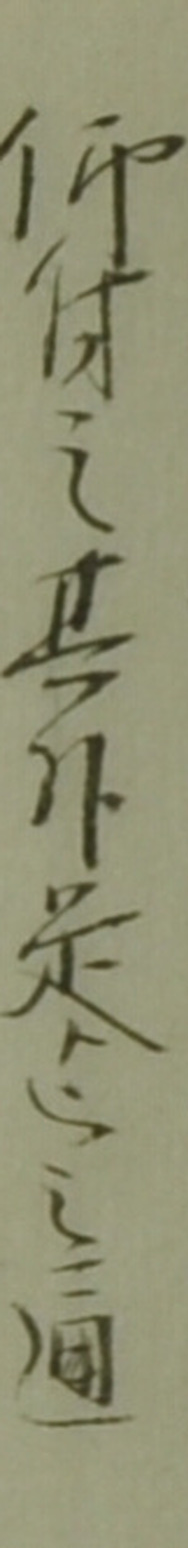仰付之其外是迄之通

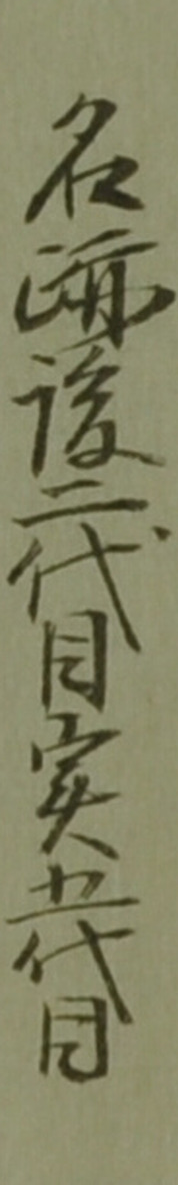名跡後二代目実五代目
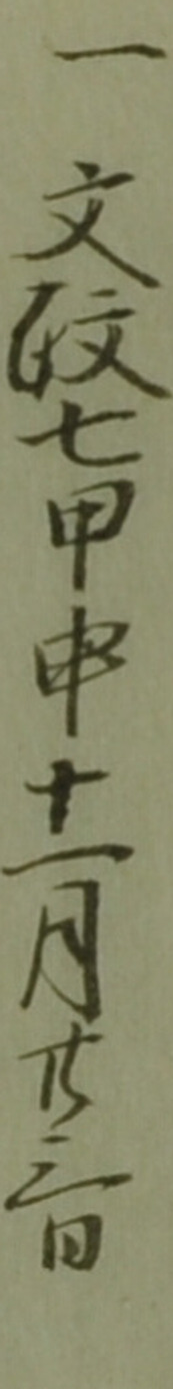一文政七甲申十一月廿三日
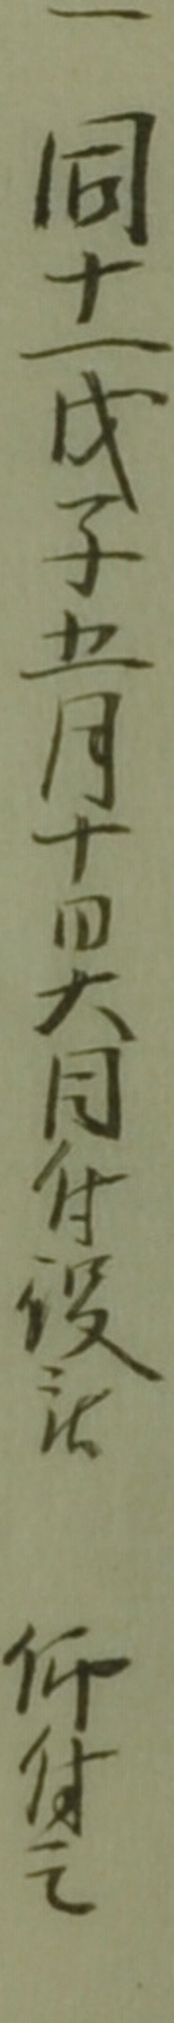一同十一戊子五月十日大目付被仰付之
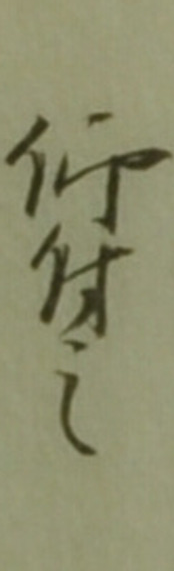仰付之
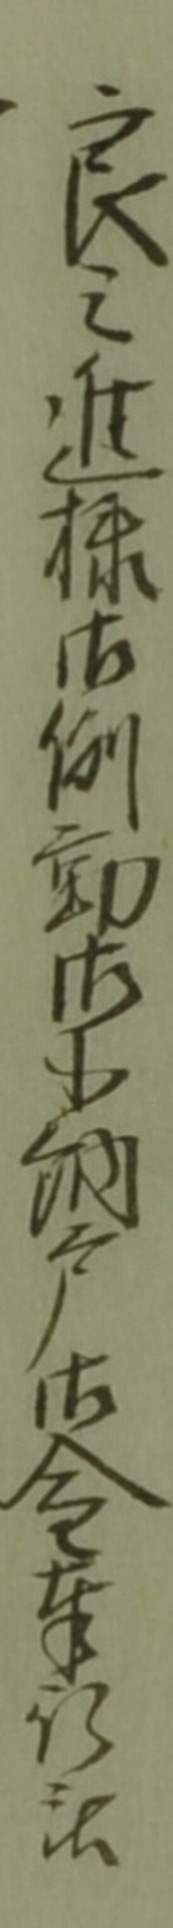良之進様御側勤御小納戸御金奉行被
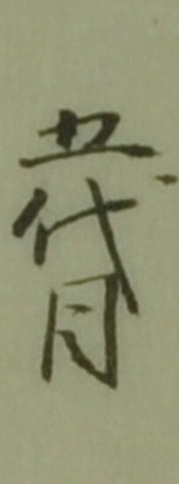五代目
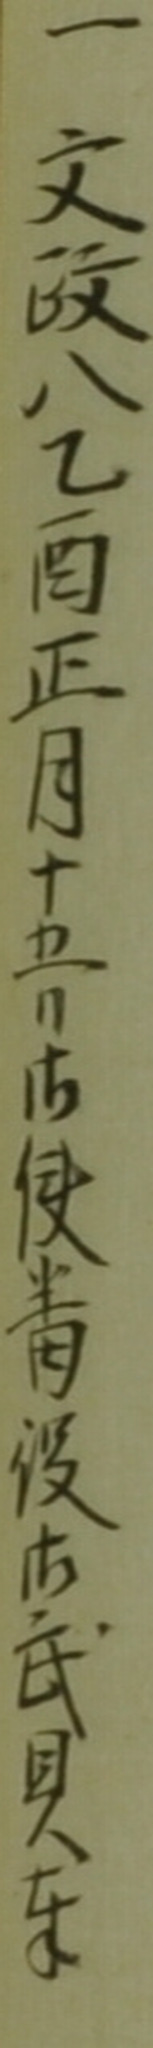一文政八乙酉正月十五日御使番役御武具奉
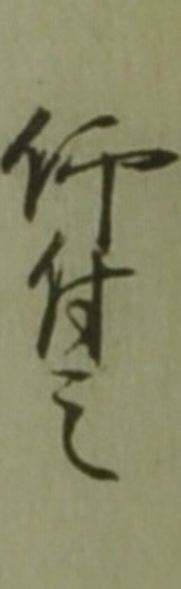仰付之
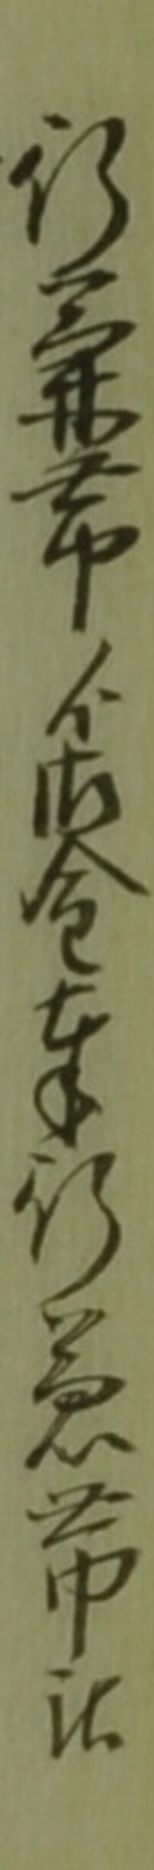行兼帯ゟ御金奉行兼帯被
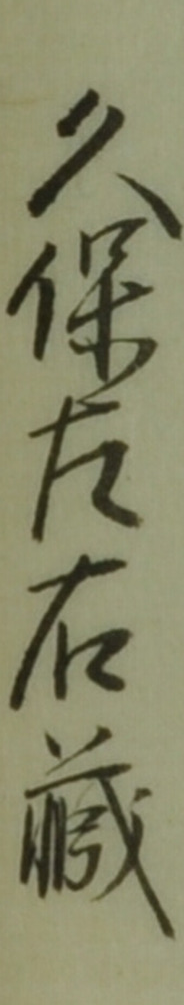久保左右蔵
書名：諸御役代々録（七）
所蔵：伊那市立高遠町図書館・合同会社AMANE
